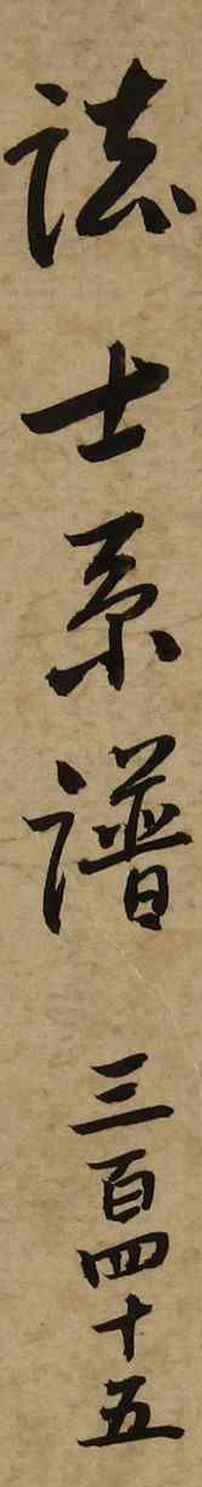諸士系譜三百四十五

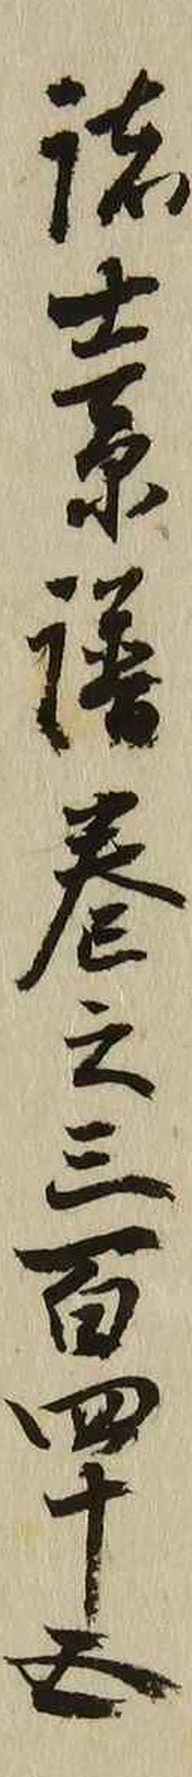諸士系譜巻之三百四十五
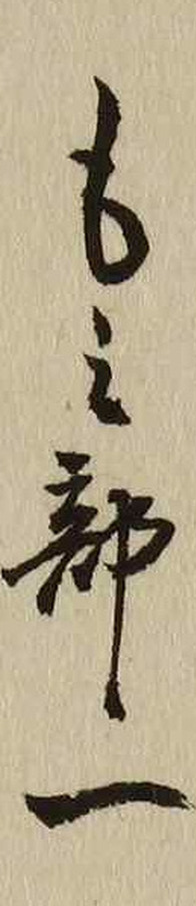も之部一
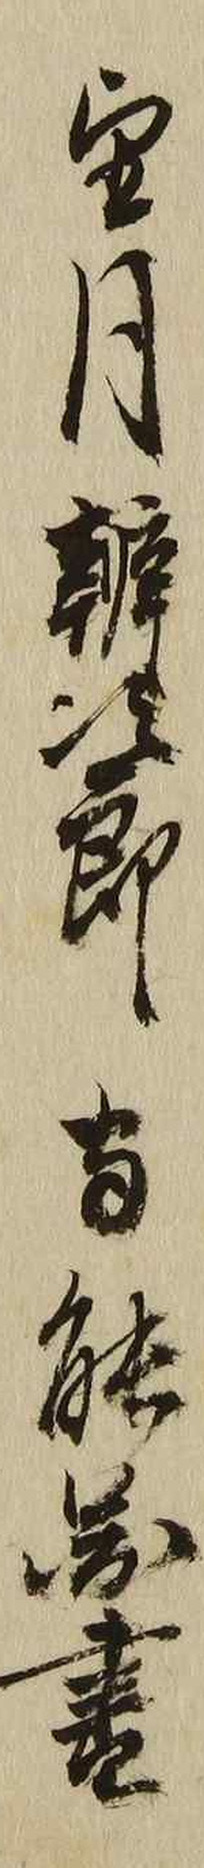望月弁次郎守能図書

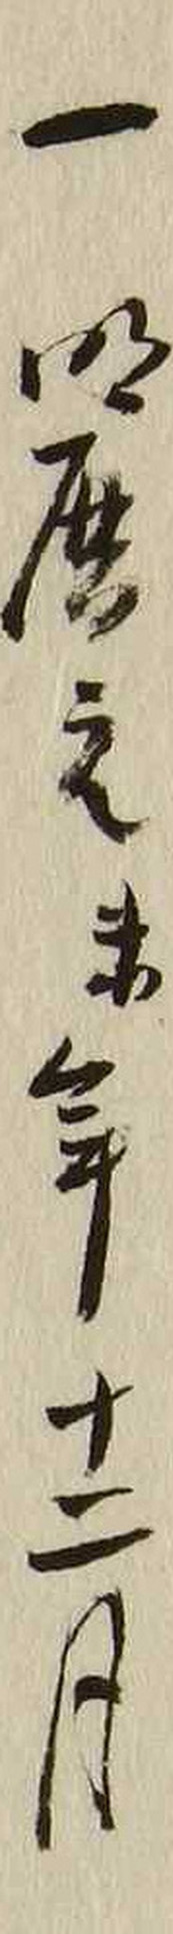一明暦元未年十二月
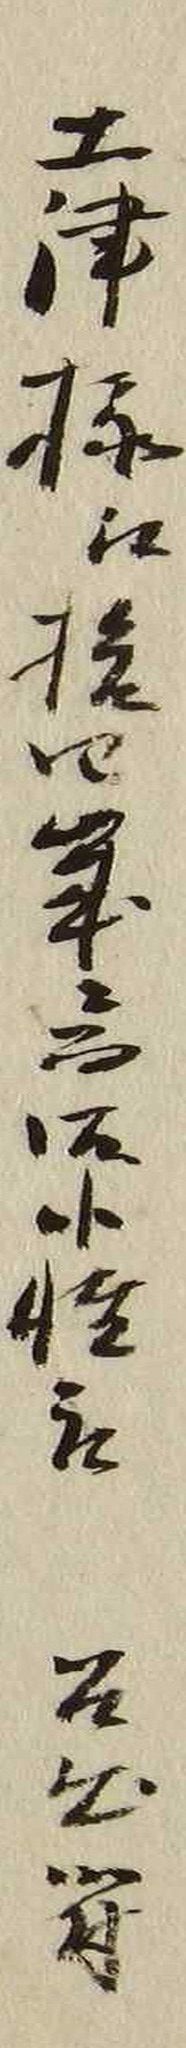土津様江拾四歳ニ而御小性被召出候付
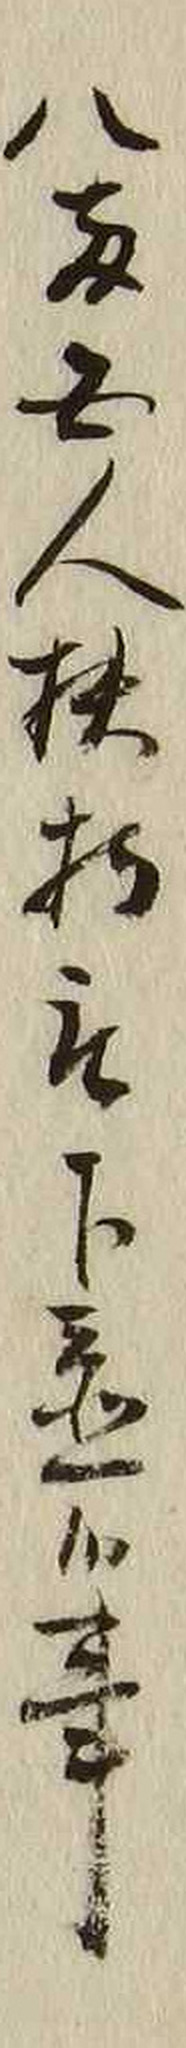八両五人扶持被下置候事
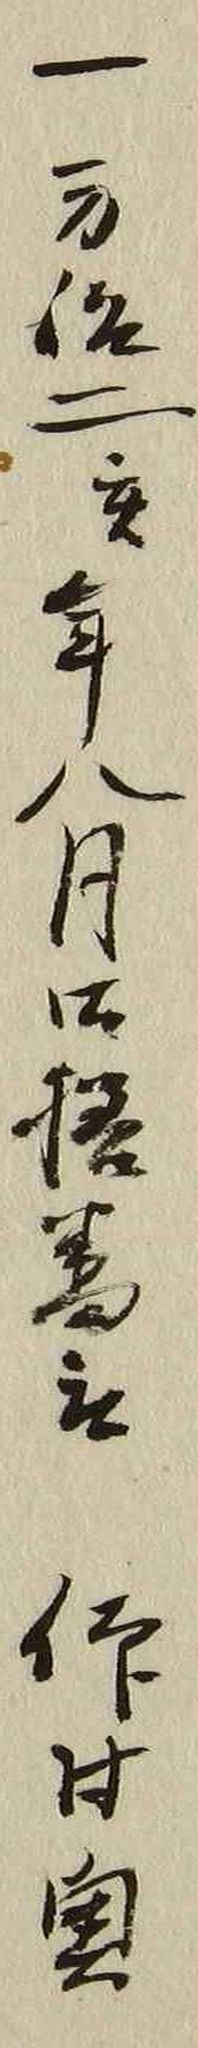一万治二亥年八月御膳番被仰付奥
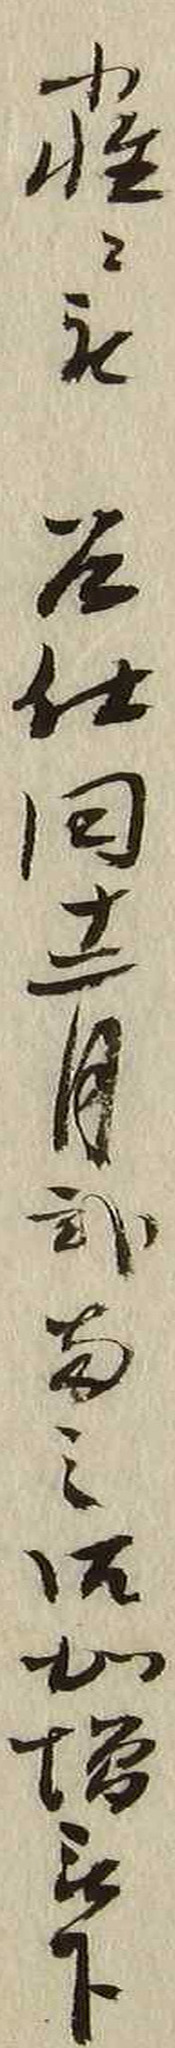小性ニ被召仕同十二月弐両之御加増被下
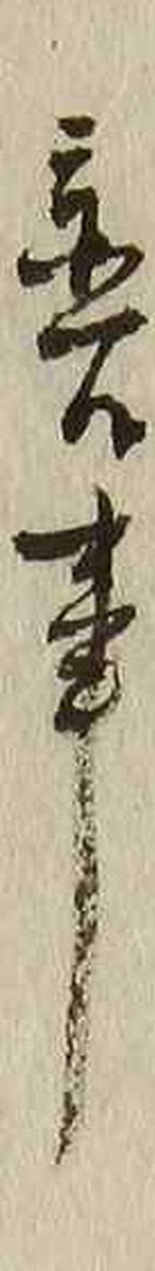置候事
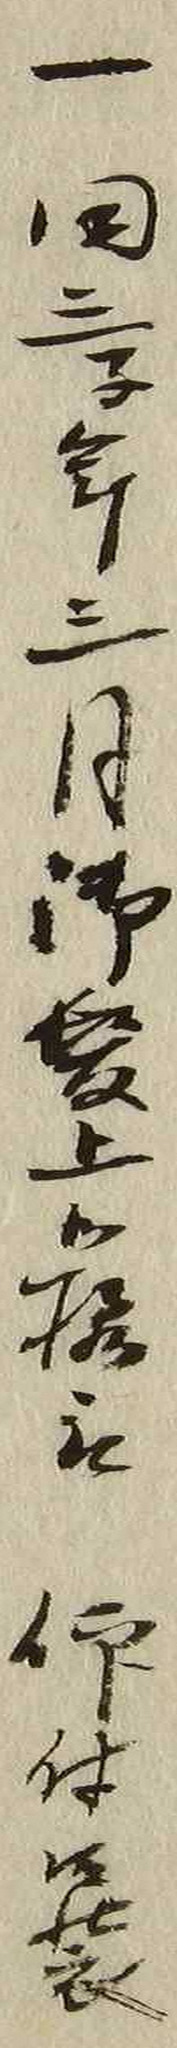一同三子年三月御髪上候様被仰付御装
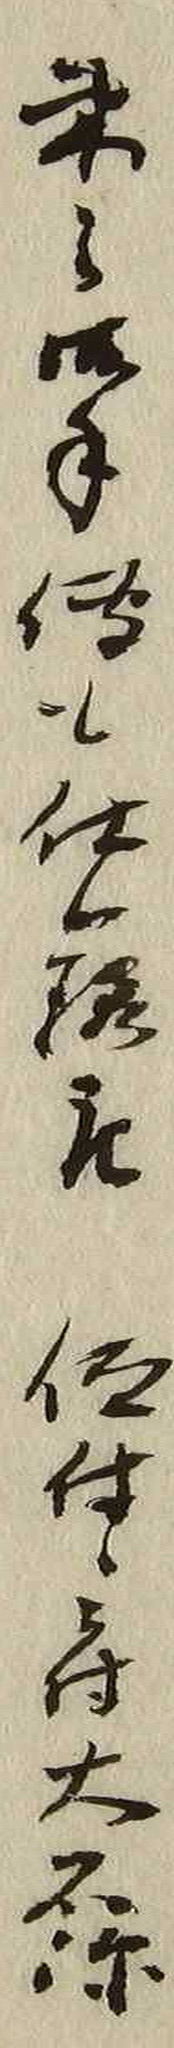束之御手伝も仕候様被仰付候ニ付大石祢
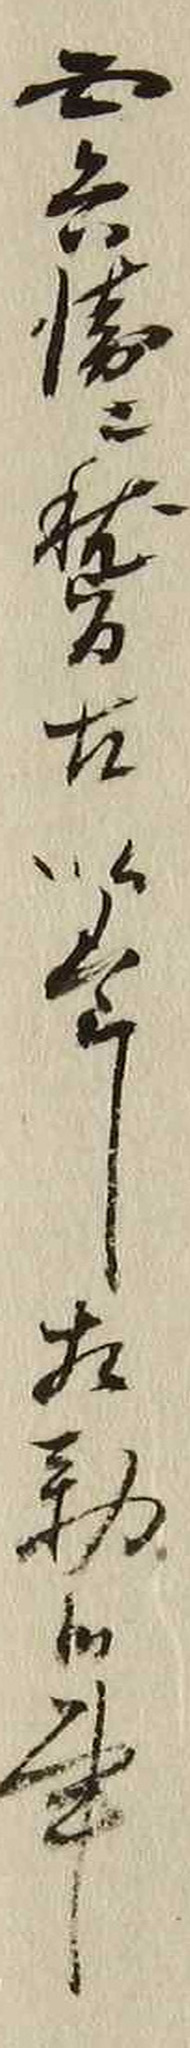五兵衛ニ稽古いたし相勤候事
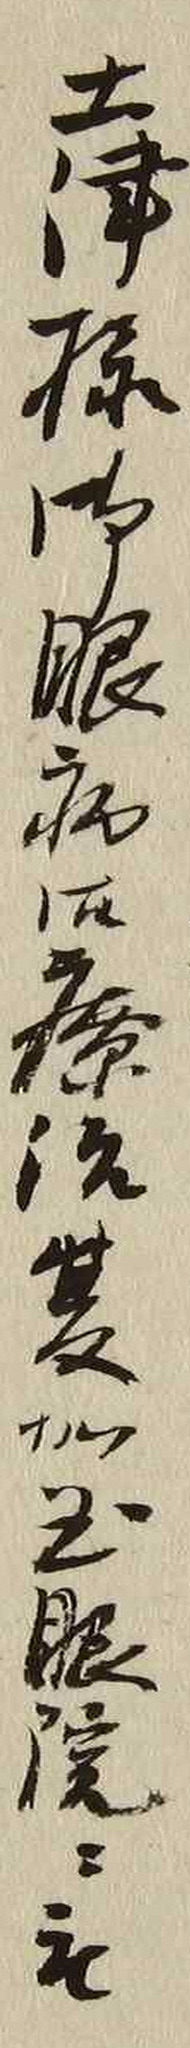土津様御眼病御療治夏加玉眼院ニ被
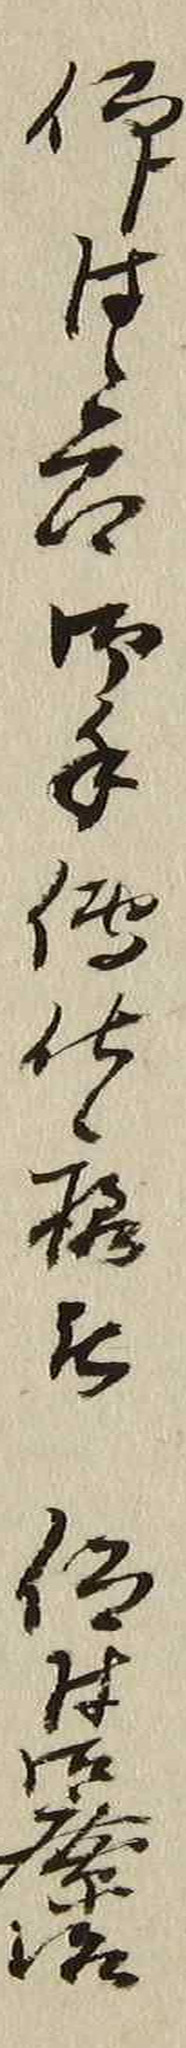仰付候節御手伝仕候様被仰付御療治
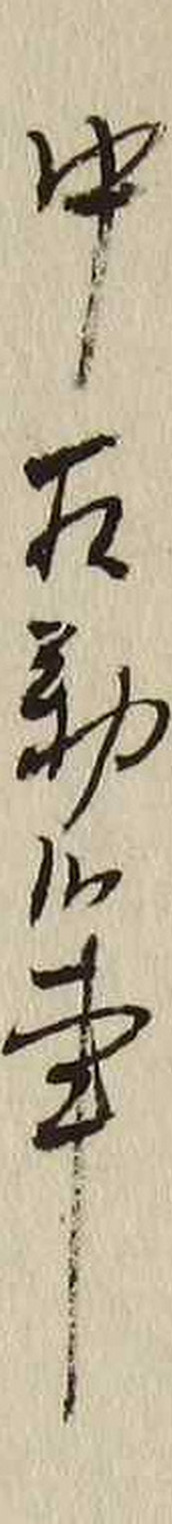中相勤候事
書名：諸士系譜　巻之345　も之部1
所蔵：会津若松市立会津図書館
